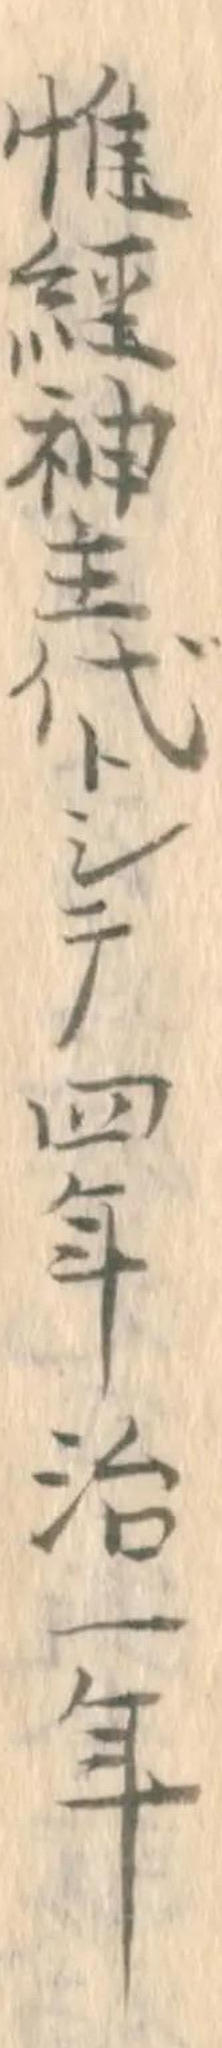惟経神主代トシテ四年治一年
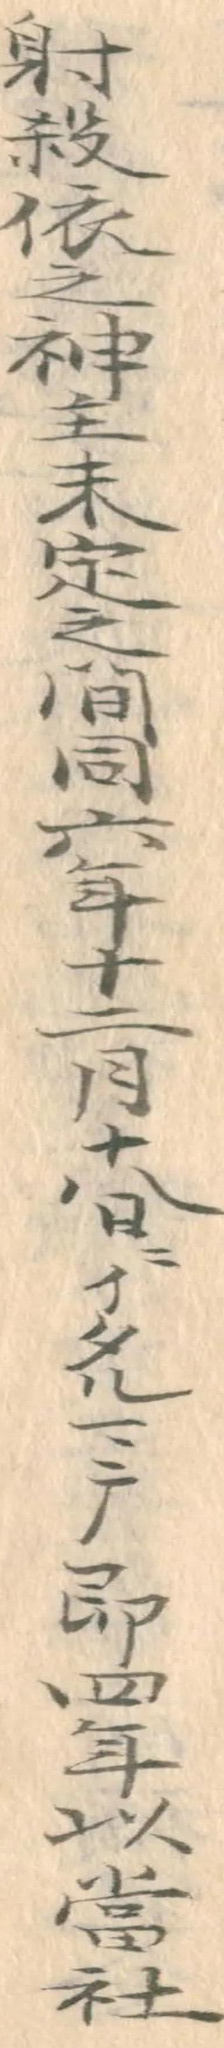射殺依之神主未定之間同六年十二月十八日ニイタルマテ即四年以当社
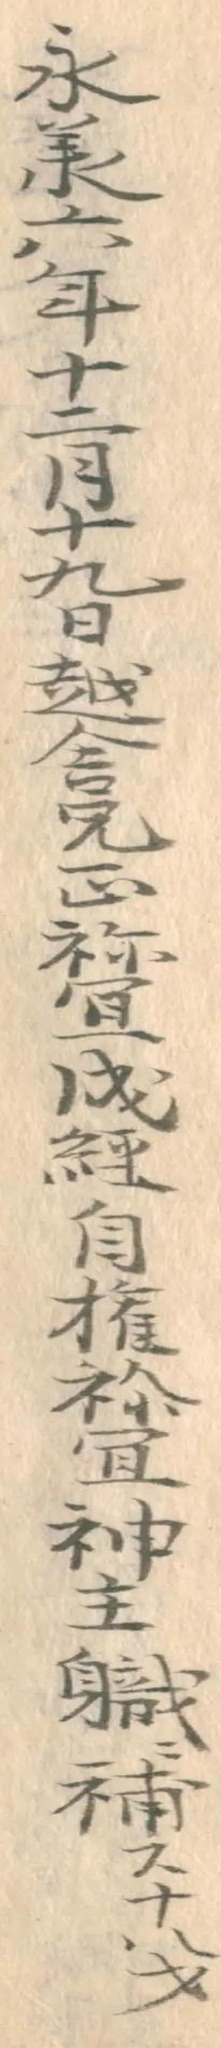成助永承六年十二月十九日越舎兄正祢宜成継自権祢宜神主職ニ補ス十八才
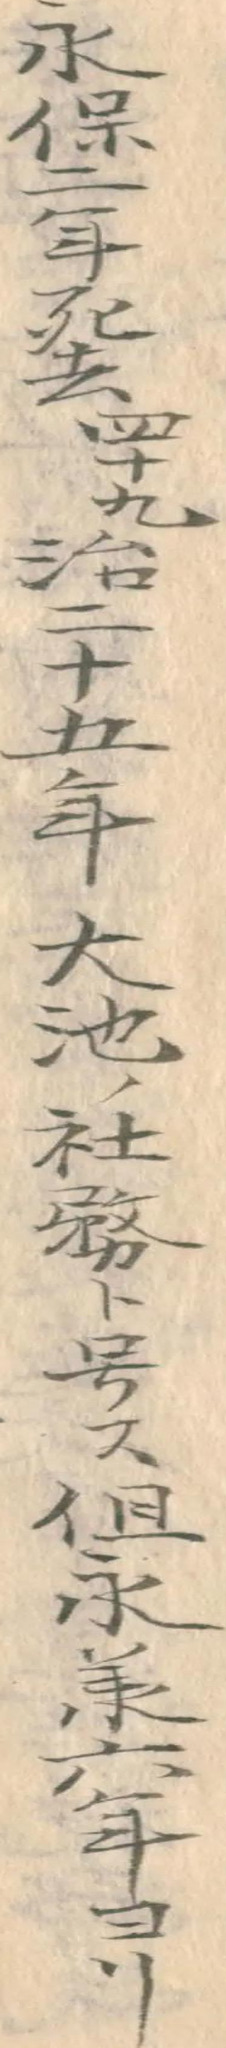永保二年死去四十九治二十五年大池ノ社務ト号ス但永承六年ヨリ
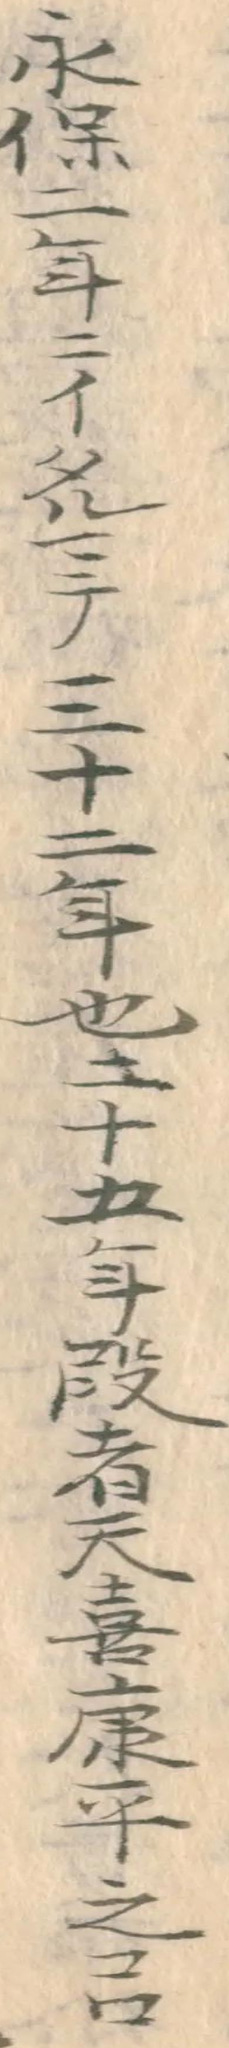永保二年ニイタルマテ三十二年也二十五年段者天喜康平之コロ
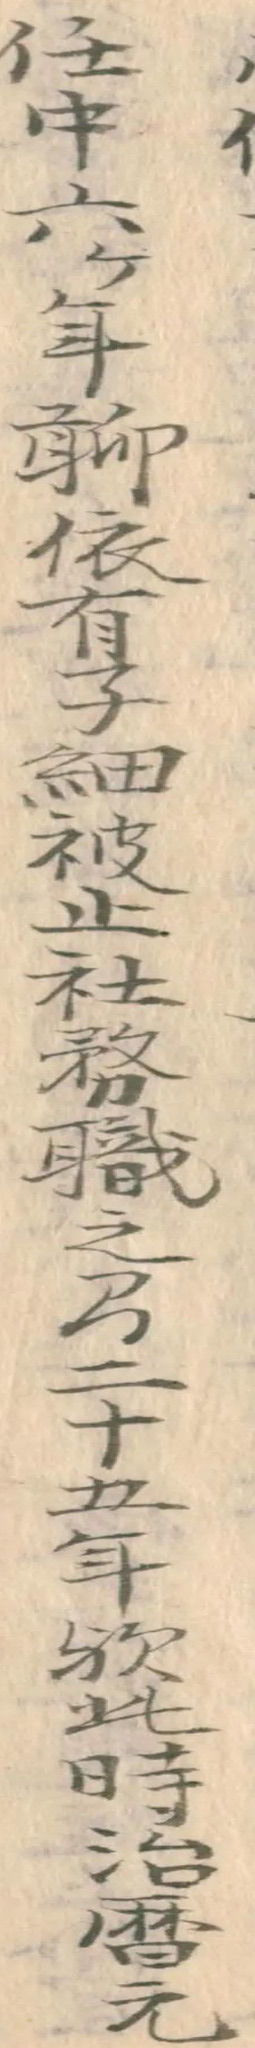任中六ケ年聊依有子細被止社務職之間二十五年歟此時治暦元
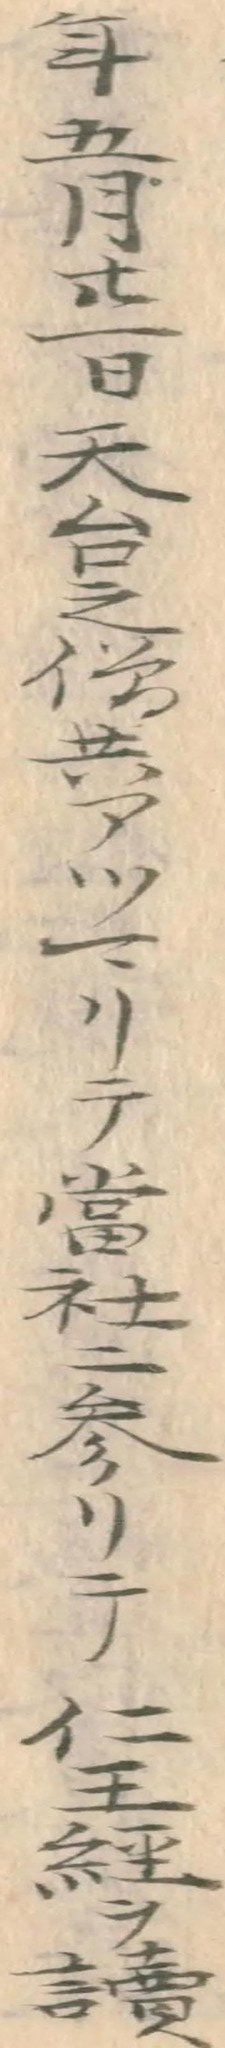年五月廿一日天台之僧共アツマリテ当社ニ参リテ仁王経ヲ読
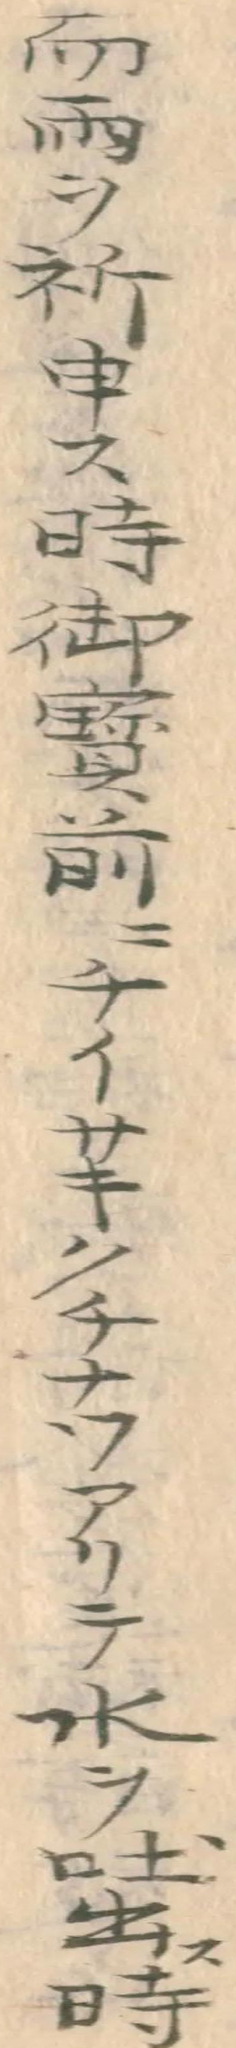而雨ヲ祈申ス時御宝前ニチイサキクチナワアリテ水ヲ吐出ス時
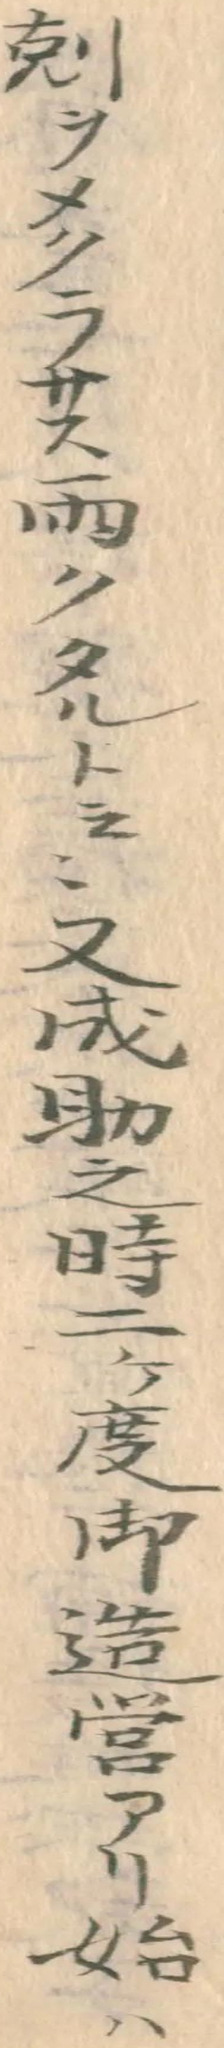剋ヲメクラサス雨クタルト云々又成助之時二ケ度御造営アリ始ハ
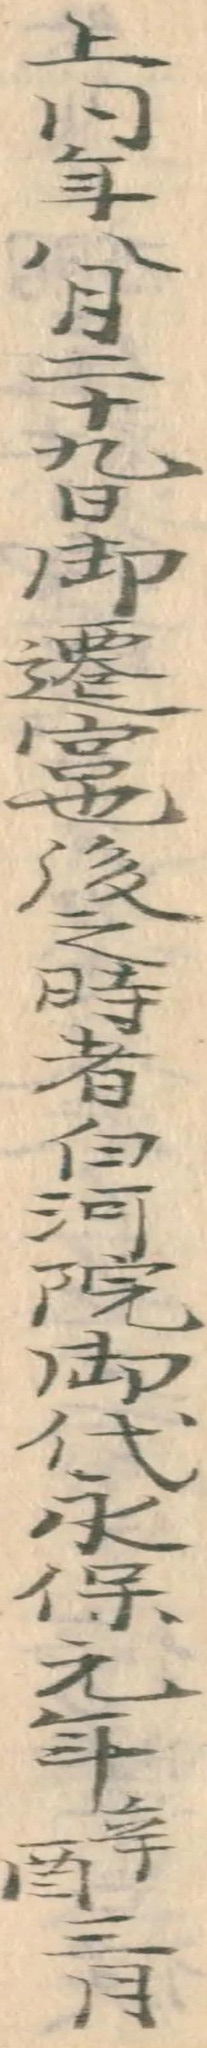上同年八月二十九日御遷宮也後之時者白河院御代永保元年辛酉三月
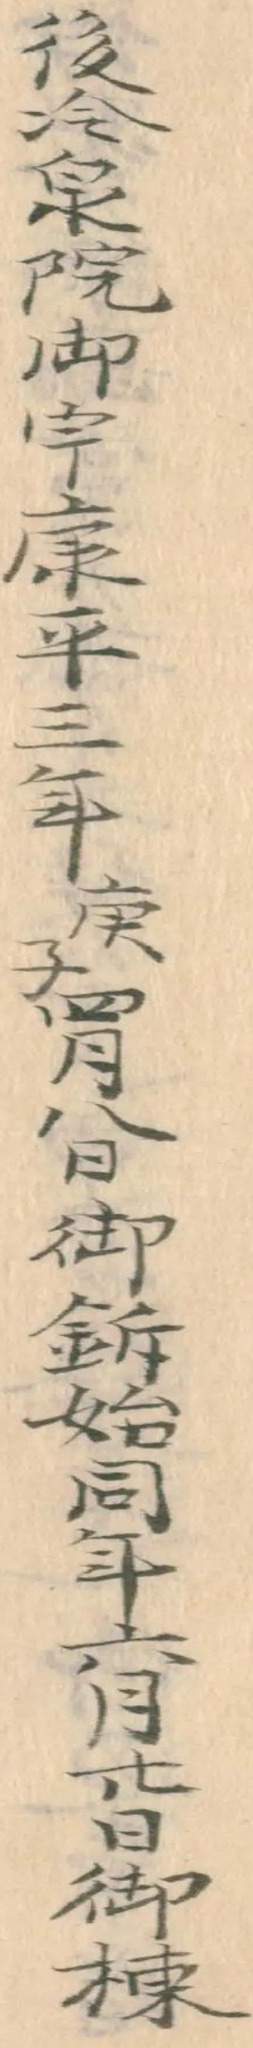後冷泉院御宇康平三年庚子四月八日御釿始同年六月廿日御棟
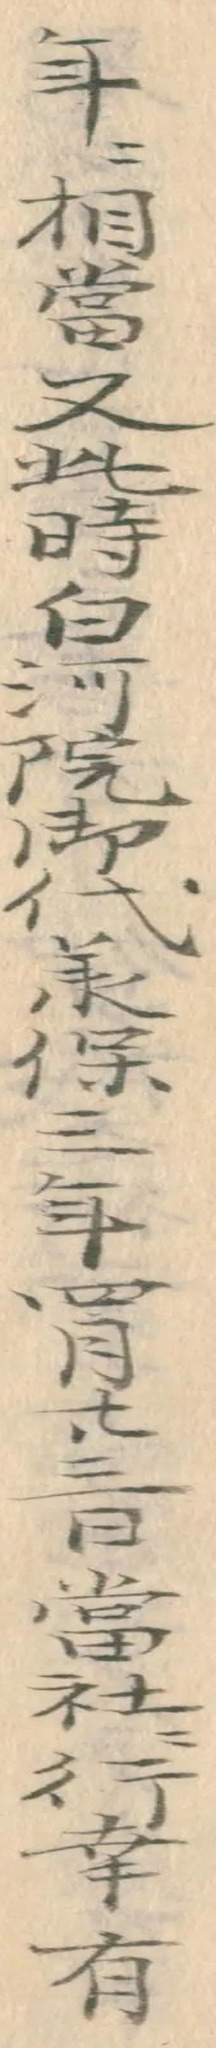年ニ相当又此時白河院御代承保三年四月廿三日当社ニ行幸有
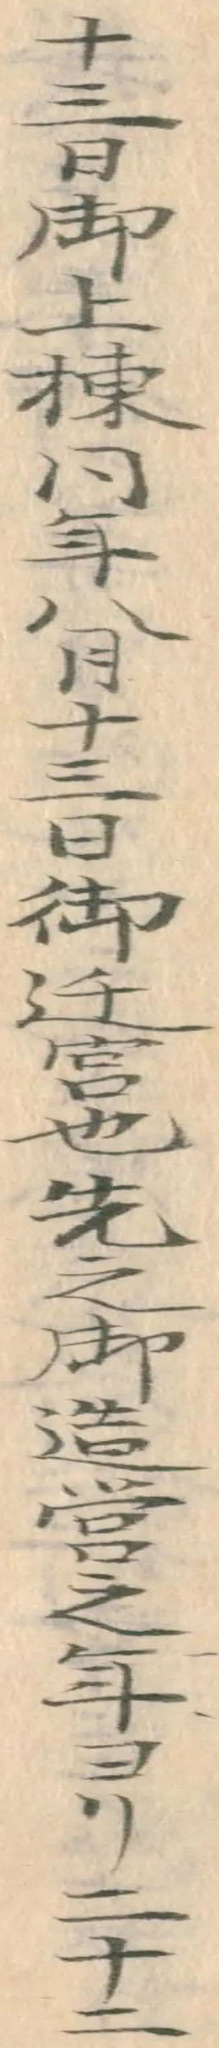十三日御上棟同年八月十三日御遷宮也先之御造営之年ヨリ二十二
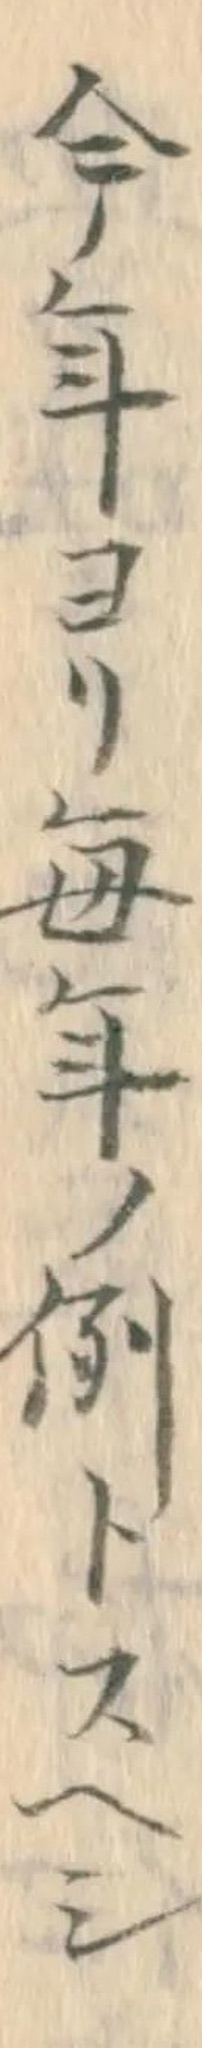今年ヨリ毎年ノ例トスヘシ
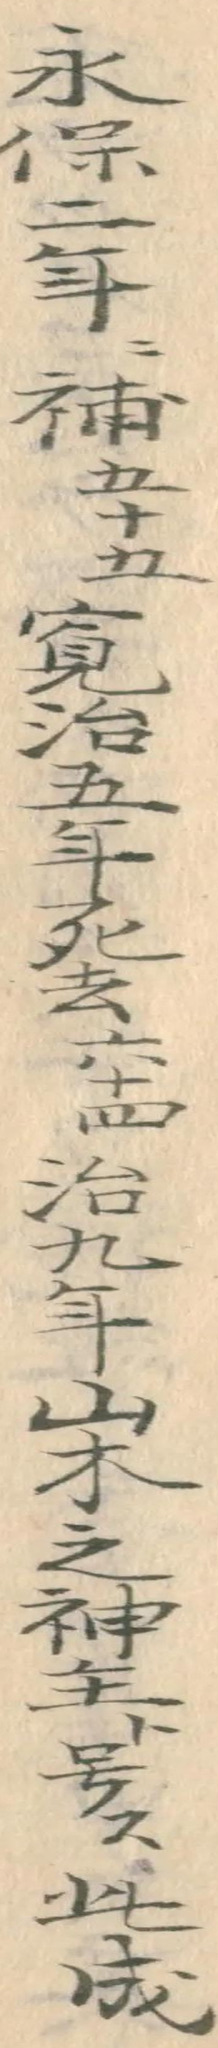成経永保二年ニ補五十五寛治五年死去六十四治九年山木之神主ト号ス此成
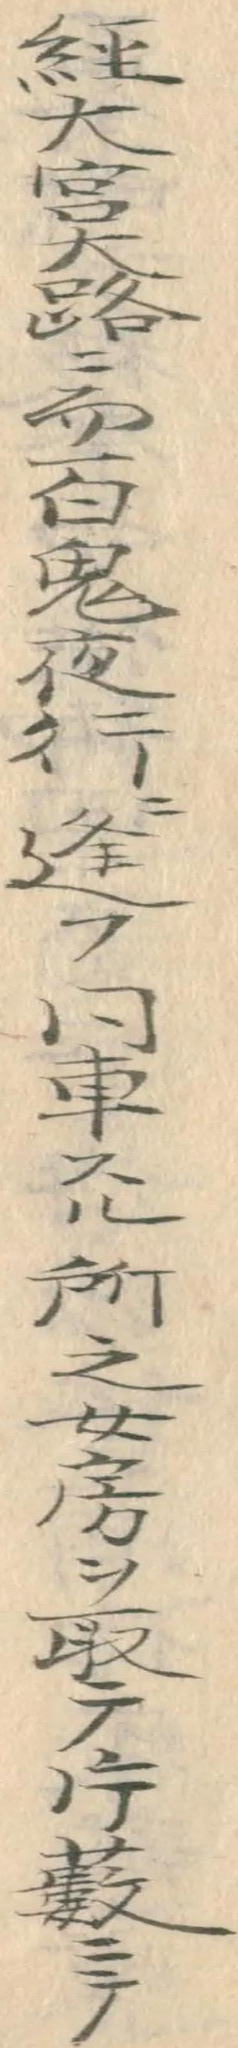経大宮大路ニ而百鬼夜行ニ逢フ同車スル所之女房ヲ取テ片藪ニテ
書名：賀茂社記録. 第24冊
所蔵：国立国会図書館 National Diet Library, JAPAN
